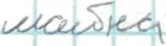майна
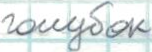голубок
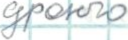дронго
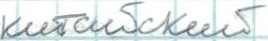китайский
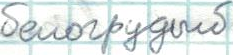белогрудый
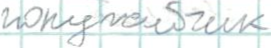попугайчик
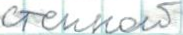степной
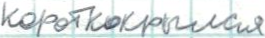короткокрылая
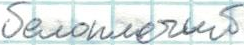белоплечий
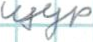щур
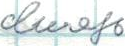свиязь
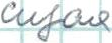сизая
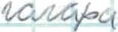гагара
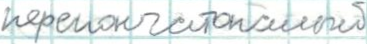перепончатопалый
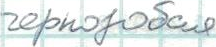чернозобая
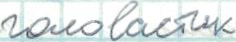головастик
